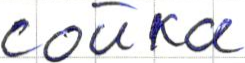сойка
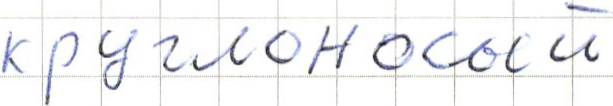круглоносый
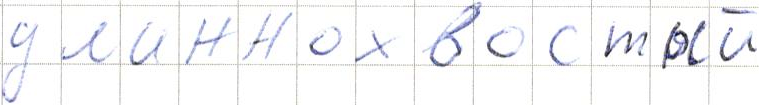длиннохвостый
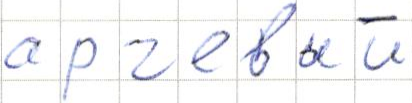арчевый
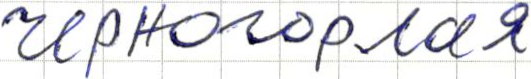черногорлая
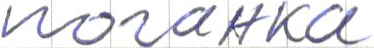поганка
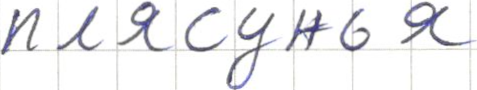плясунья
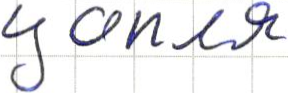цапля
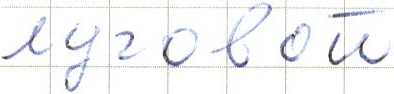луговой
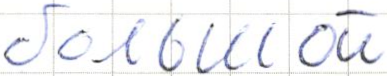большой
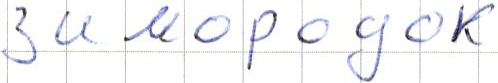зимородок
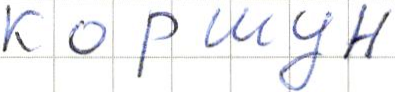коршун
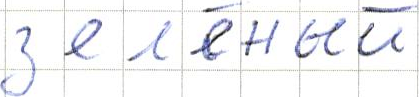зелёный
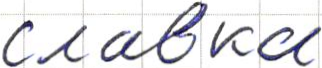славка
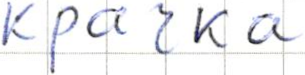крачка
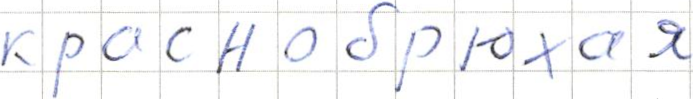краснобрюхая
